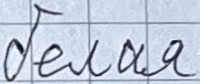белая
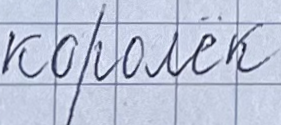королёк
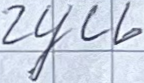гусь
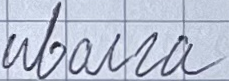иволга
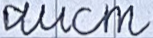аист
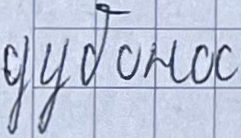дубонос
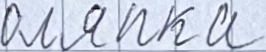оляпка
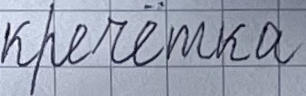кречётка
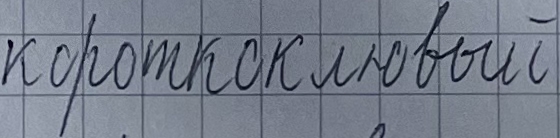короткоклювый
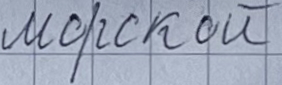морской
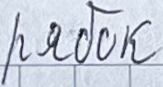рябок
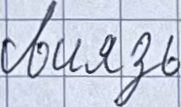свиязь
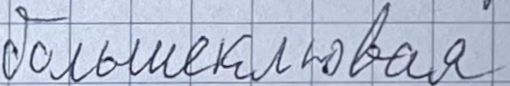большеклювая
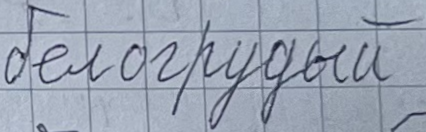белогрудый
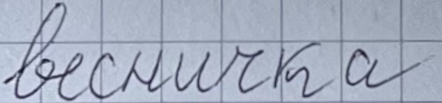весничка
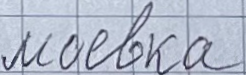моевка
